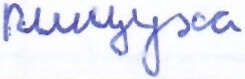пищуха
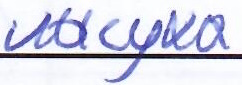лысуха
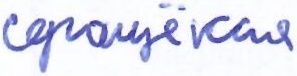серощёкая
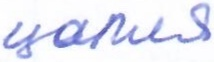цапля
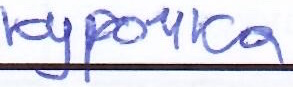курочка
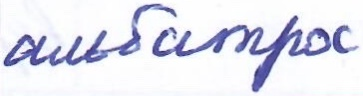альбатрос
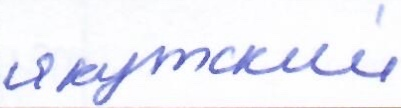якутский
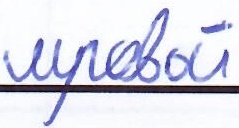луговой
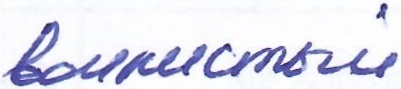волнистый
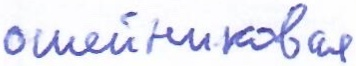ошейниковая
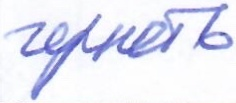чернеть
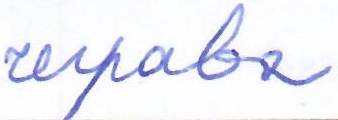чеграва
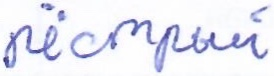пёстрый
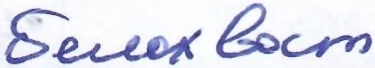белох вост
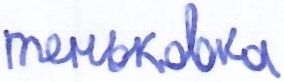теньковка
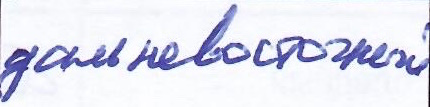дальневосточный
